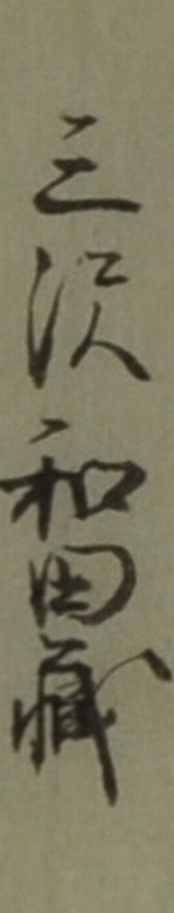三沢和田藏

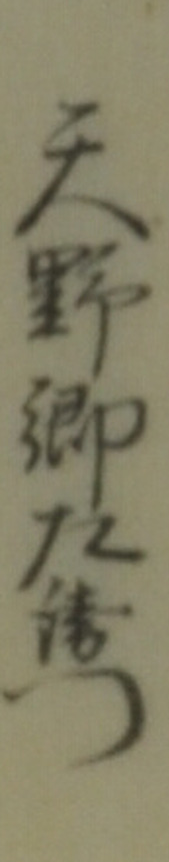天野郷左衛門

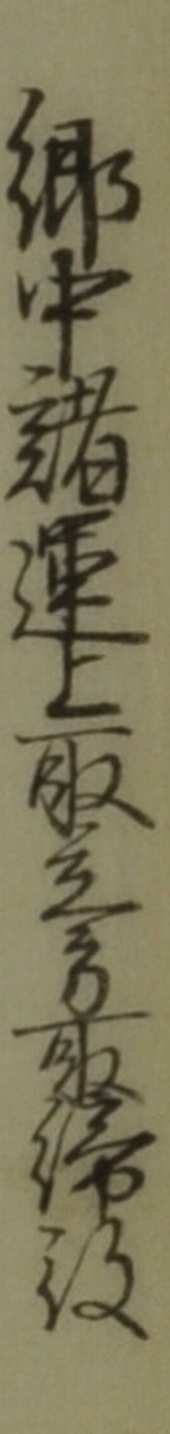郷中諸運上取立方取締役
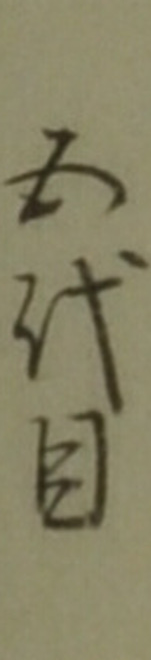五代目
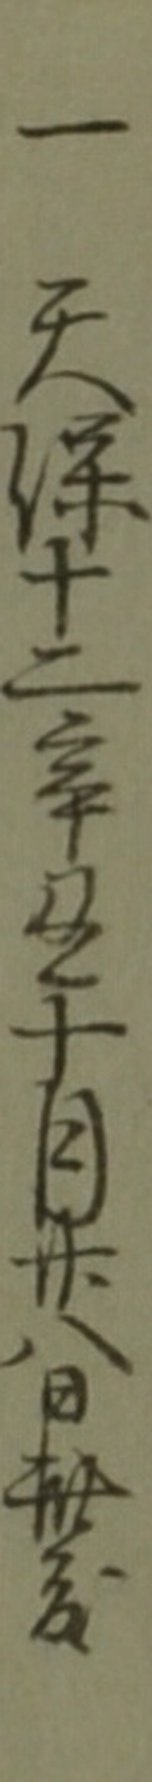一天保十二辛丑十月廿八日此度
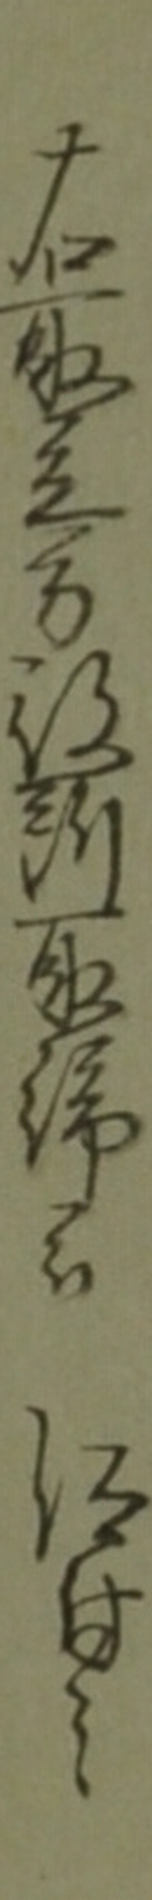右取立方役所取締被仰付之
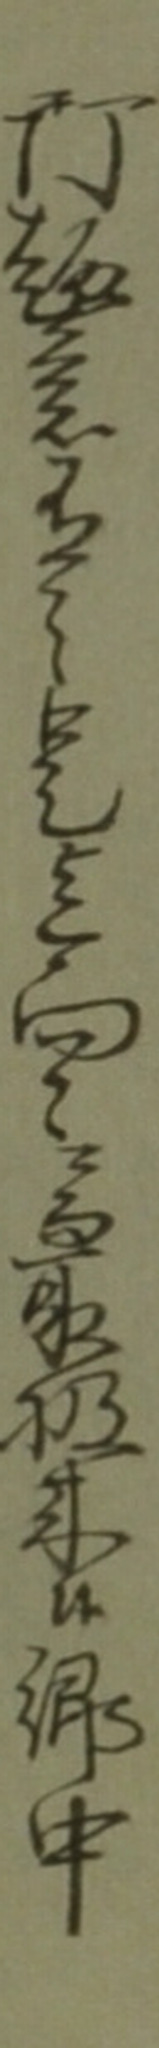御趣意有之是迄向々ニ而取扱来候郷中
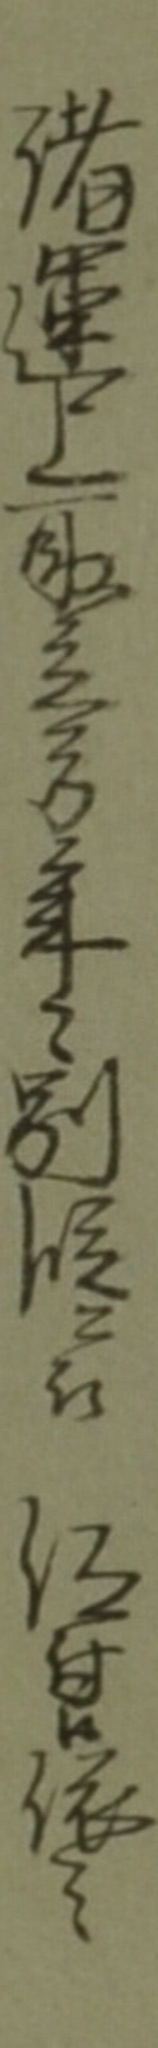諸運上取立方年々別段ニ被仰付候依之
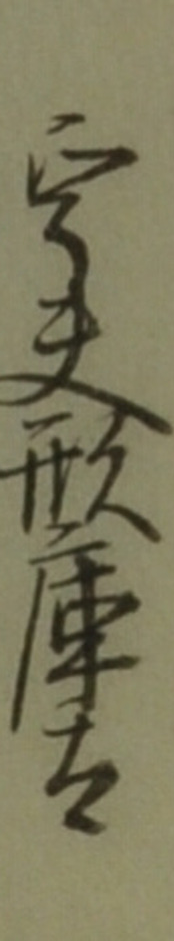宇夫形庫太
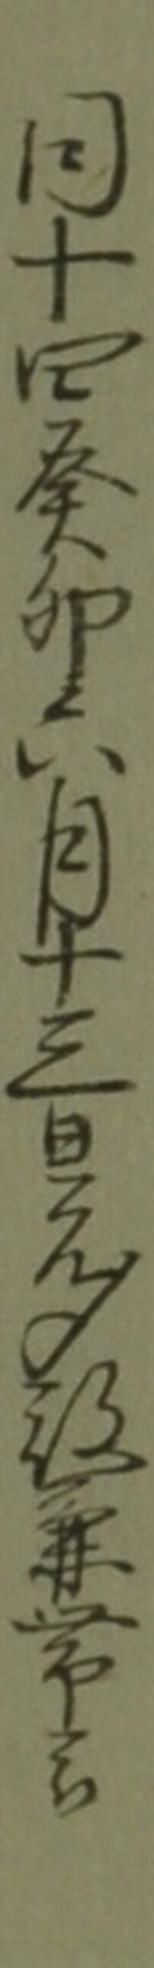一同十四癸卯六月十三日元〆役兼帯被
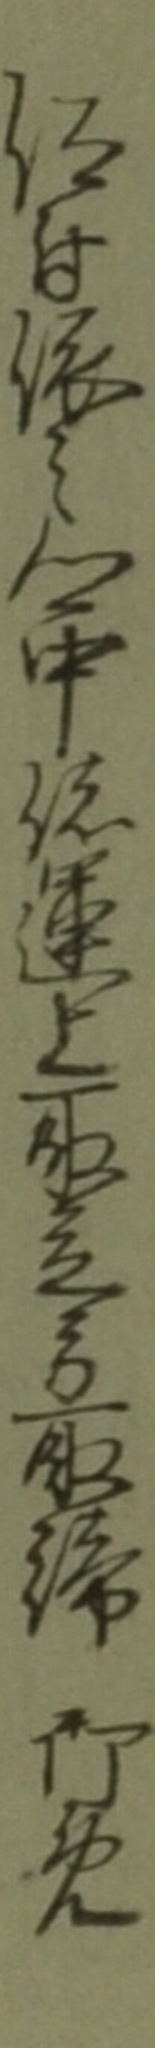仰付依之郷中諸運上取立方取締御免
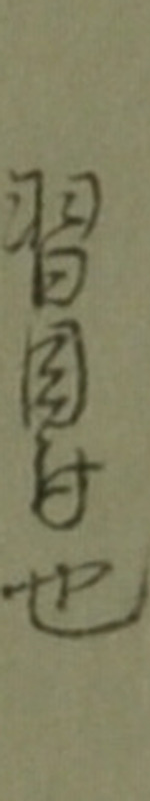習目付也
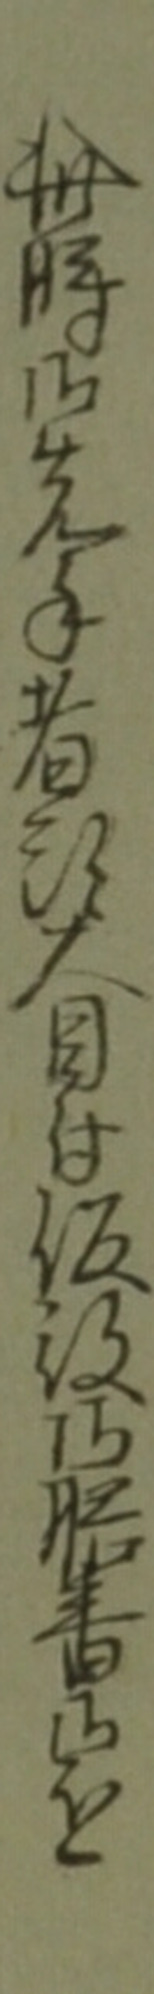此時御先者頭大目付仮役御膳番御近
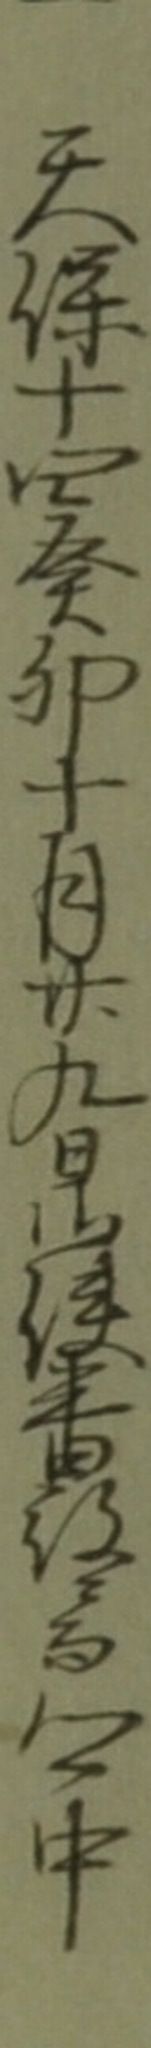一天保十四癸卯十月廿九日御使番役ニ而郷中
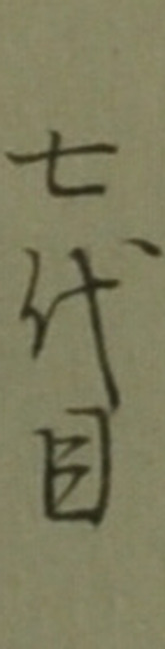七代目
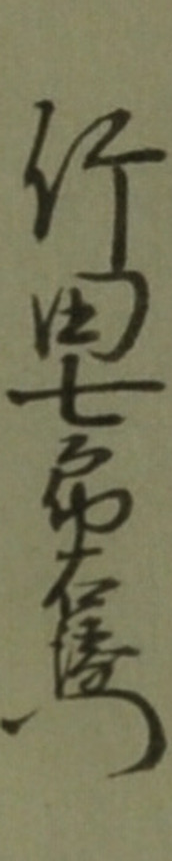竹田七郎右衛門
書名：諸御役代々録（三）
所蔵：伊那市立高遠町図書館・合同会社AMANE
